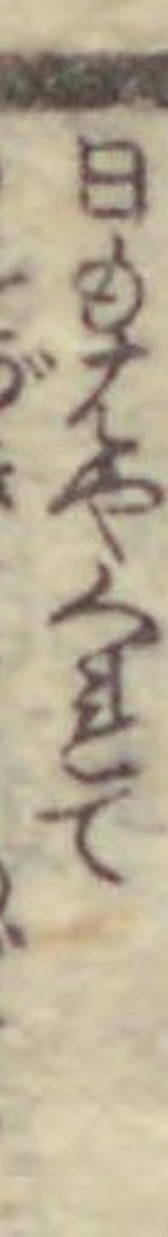日もはやくれて
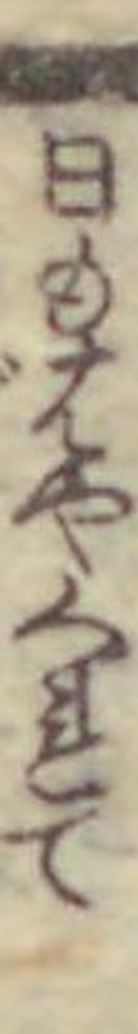日もはやくれて
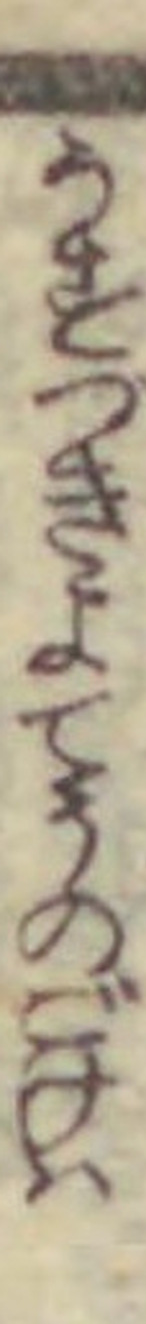うすづきよてうのごけは
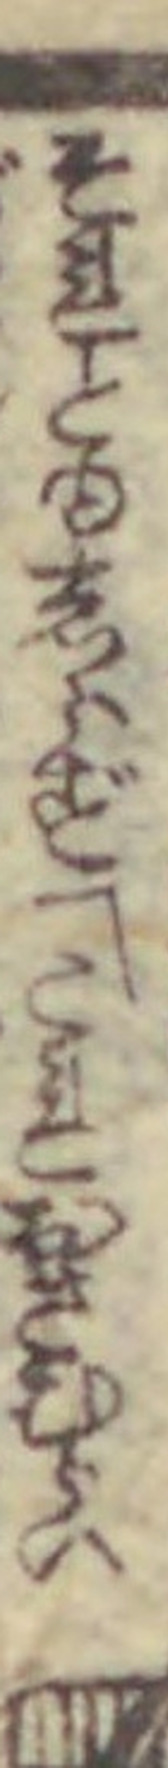それともしらず〽これおさむらい
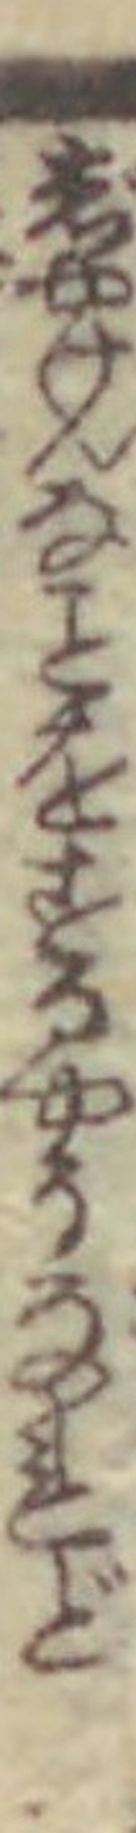じやけんなことをするやうなれど
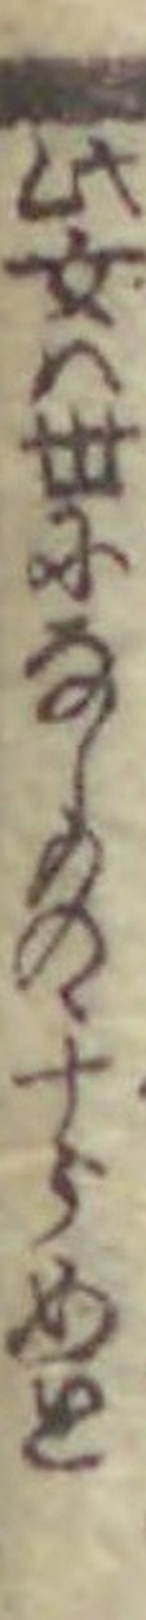此女は世になしものゝ十郎めと
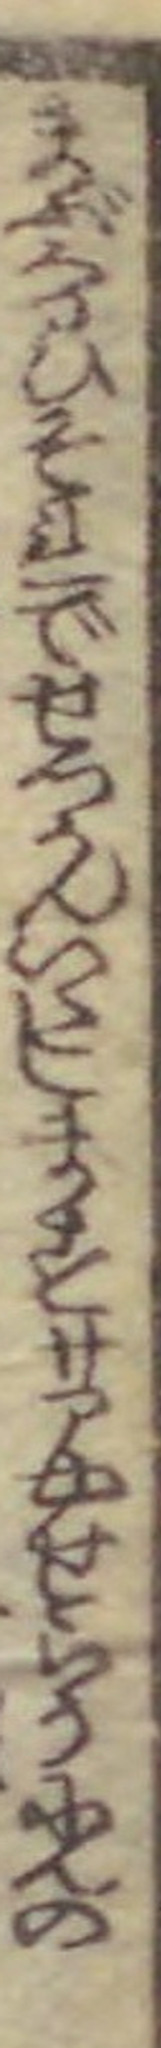まぶくるひそれでせつかんいたしますサアやせらうにんの
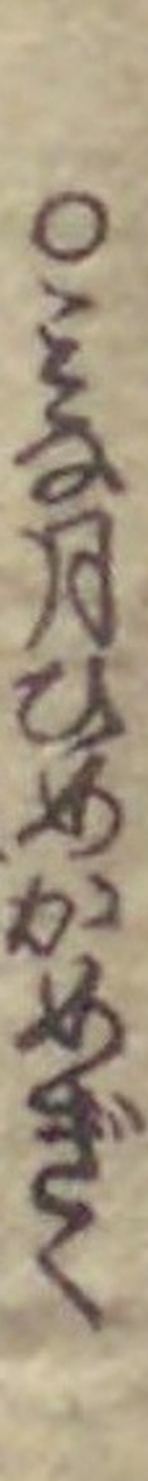○みな月ひめかめぎく
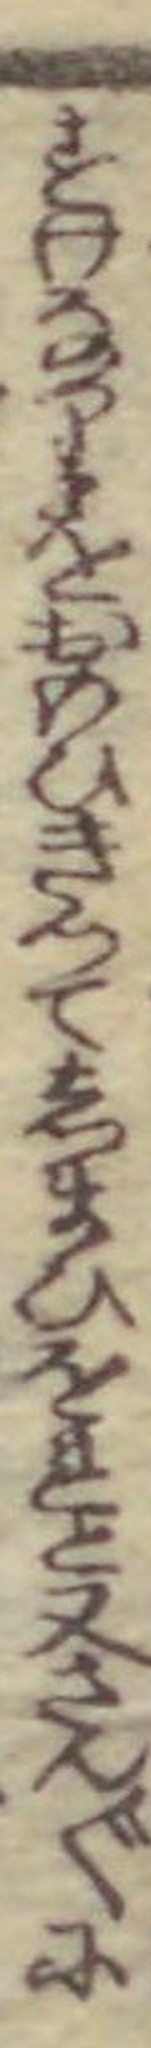すけなりをおもひきつてしまひをれと又さん〴〵に
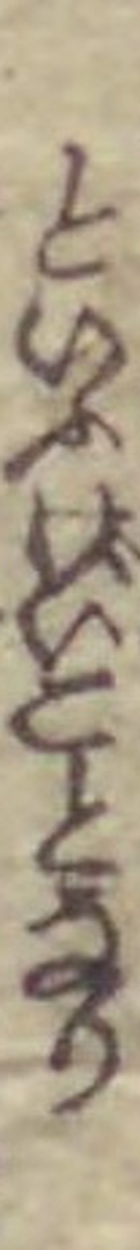といふげいことなり
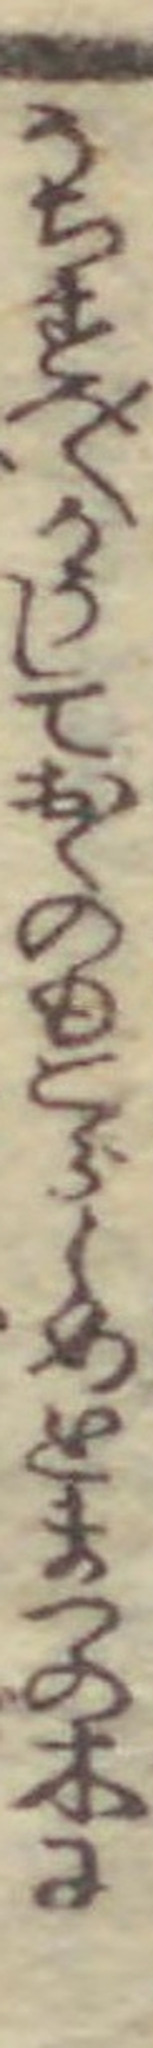うちすへ〳〵かうしておくのもこらしめとまつの木に
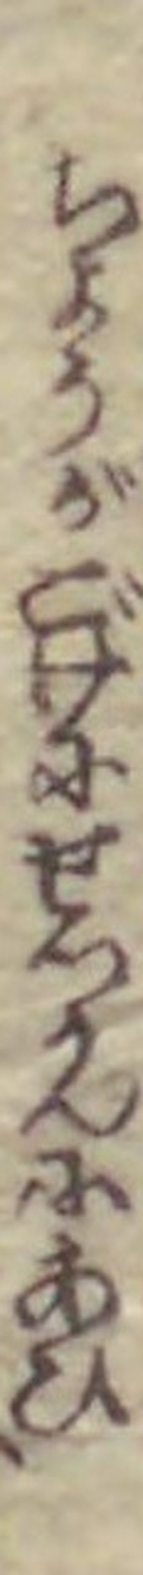ちようがごけにせつかんにあひ
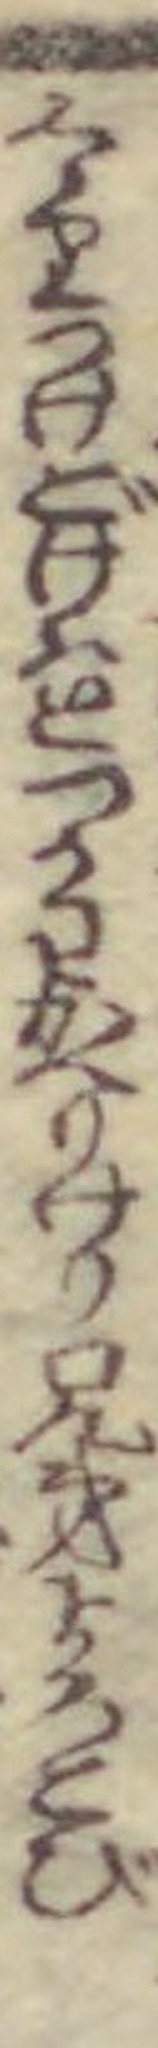くゝりつけごけはとつかわかへりけり兄弟よろこび
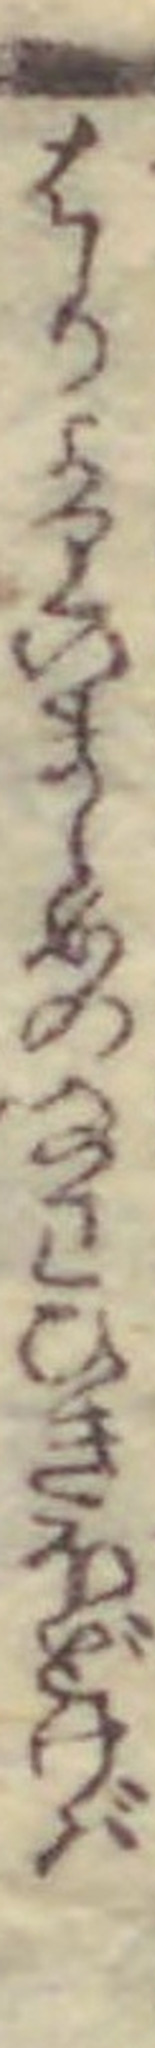はしりよりいましめのなわひきほどけば
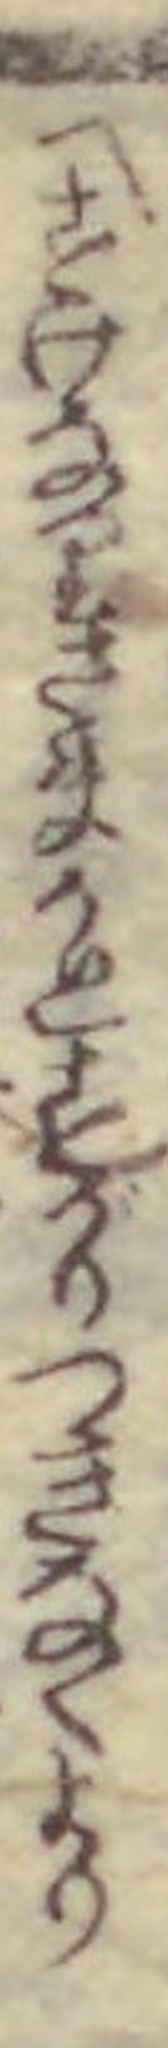〽すけなりさまかとすがりつきなくより
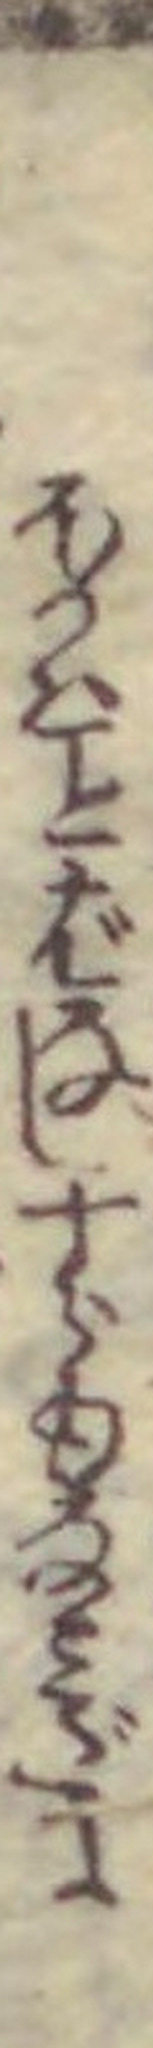ほかはことばはし十郎もなみだに
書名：大時代唐土化物 3巻. 曽我太夫染
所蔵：国立国会図書館 National Diet Library, JAPAN
